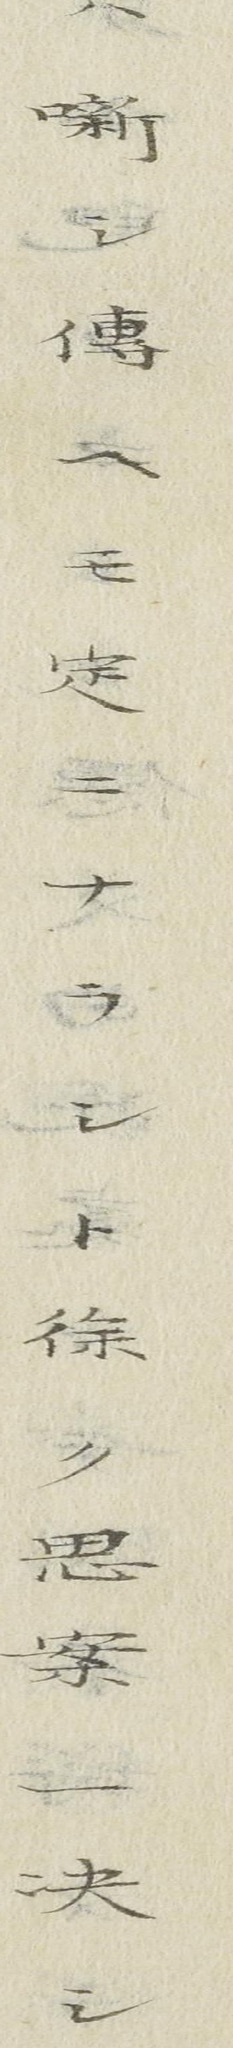ハ噺シ伝ヘモ定ニナラント徐ク思案一決シ

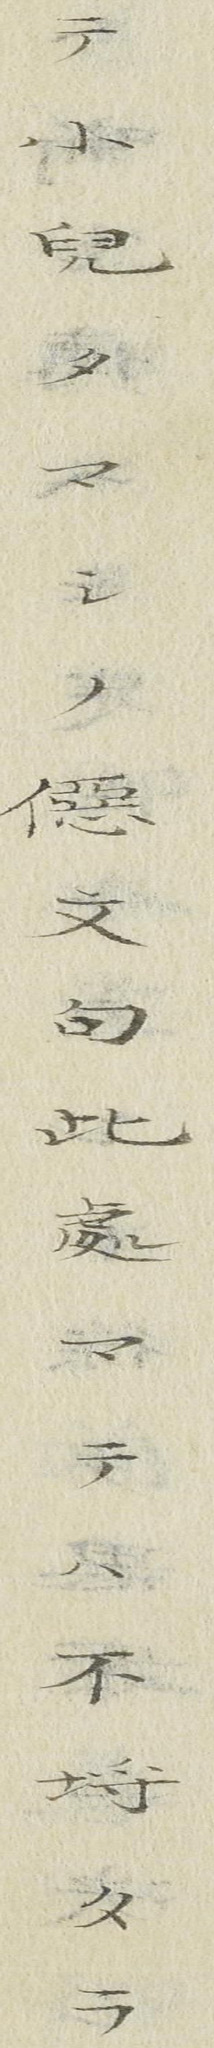テ小児タマシノ悪？文句此処マテハ不埒タラ
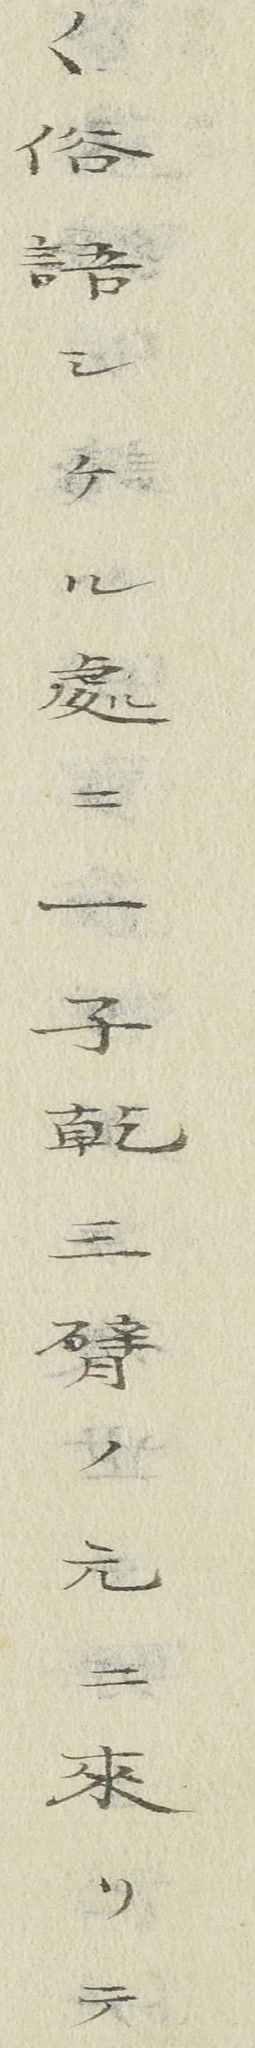〱俗語シケル処ニ一子乾三臂ノ元ニ来リテ
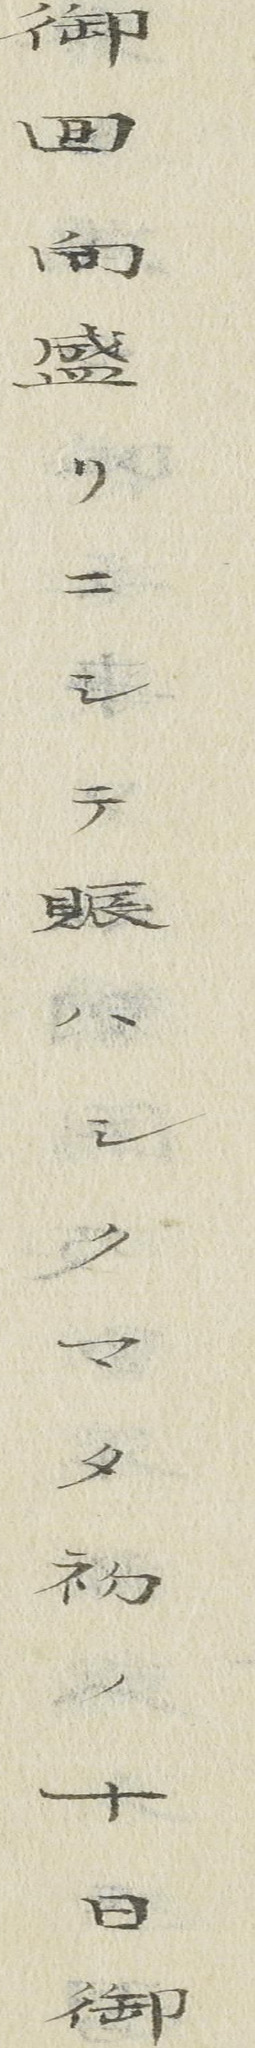御回向盛リニシテ賑ハシクマタ初ノ十日御
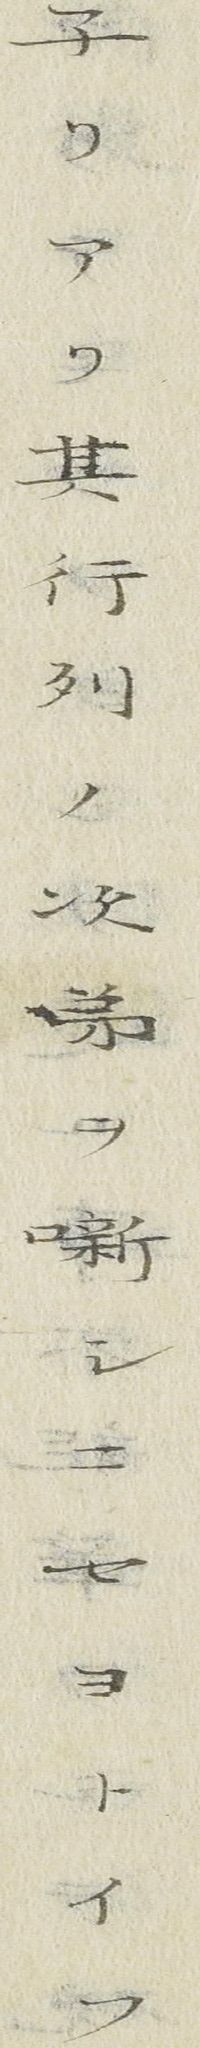子リアリ其行列ノ次第ヲ噺シニセヨトイフ
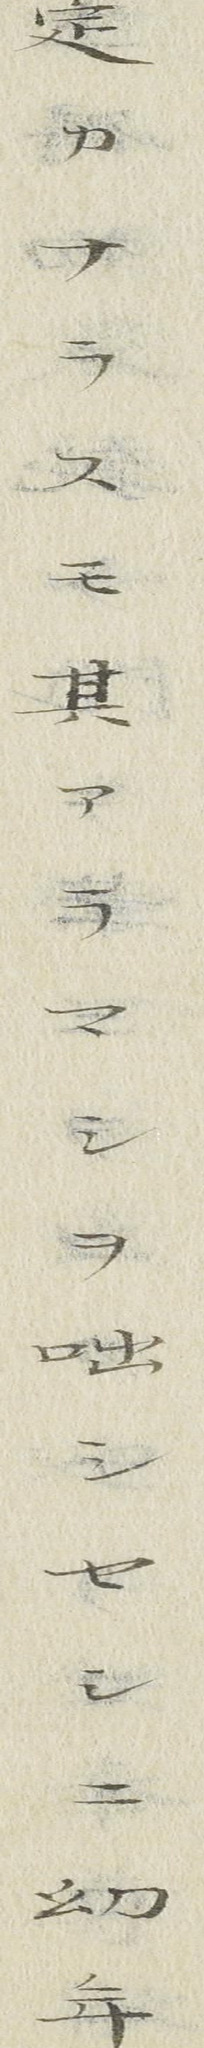定カナラスモ其アラマシヲ咄シセシニ幼年
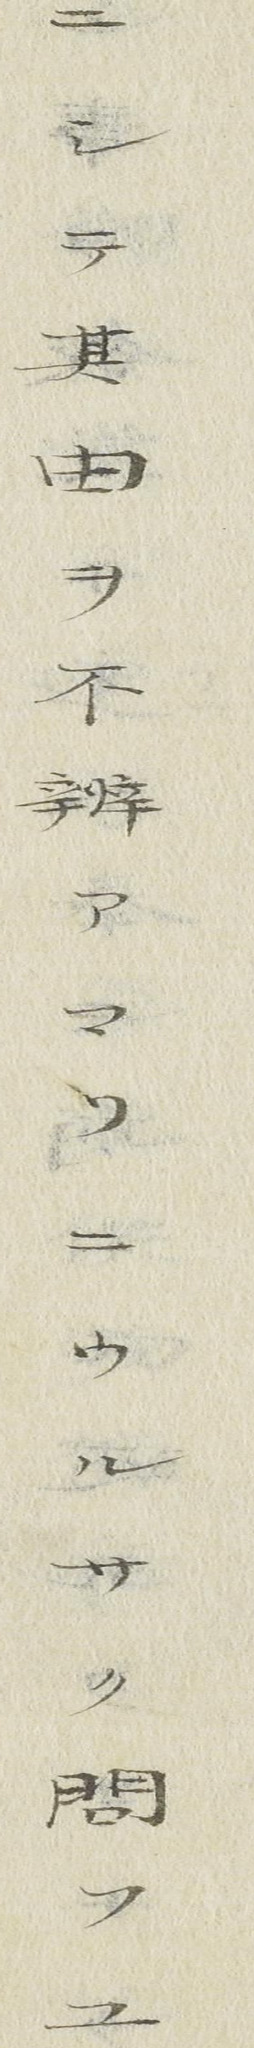ニシテ其由ヲ不弁アマリニウルサク問フユ
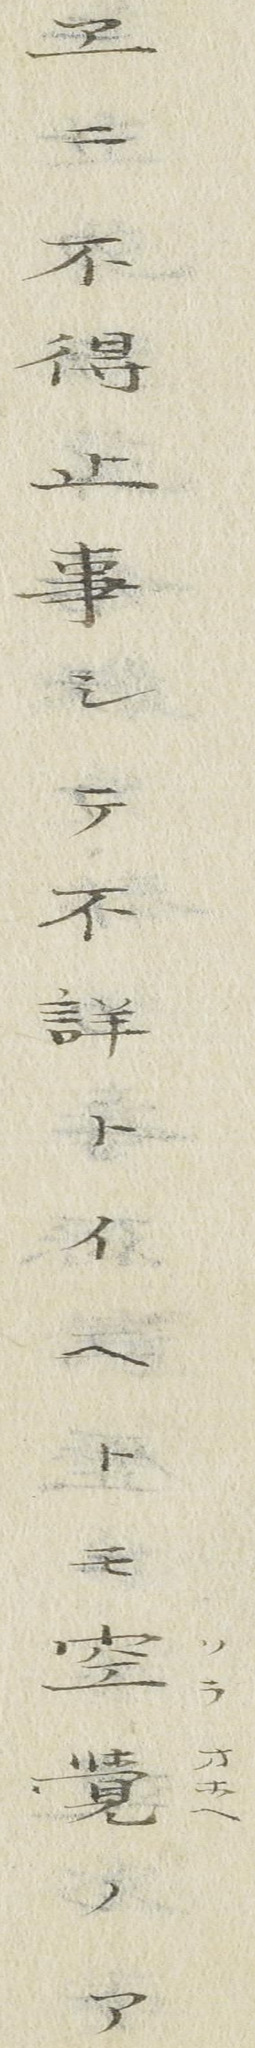エニ不得止事シテ不詳トイヘトモ空覚ノア
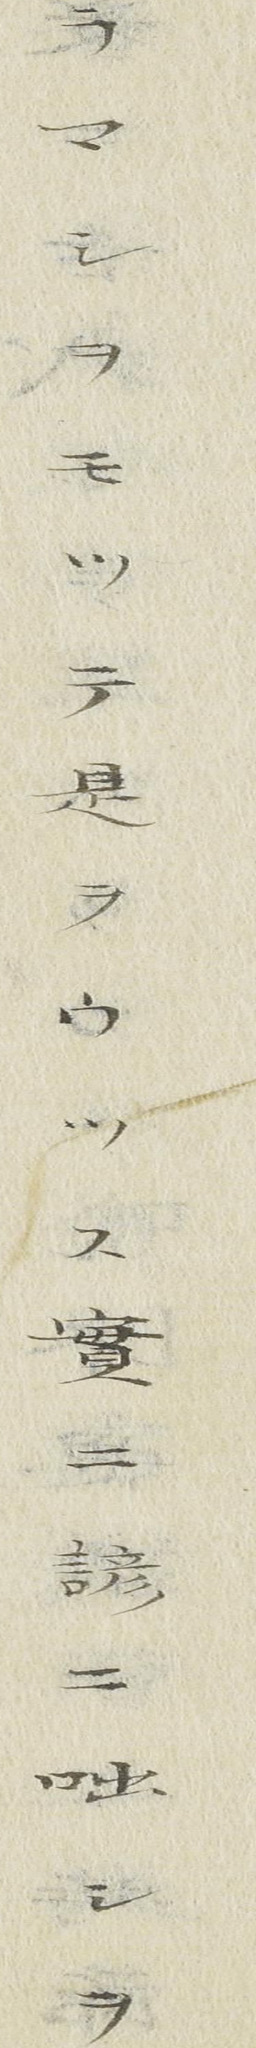ラマシヲモツテ是ヲウツス実ニ諺ニ咄シヲ
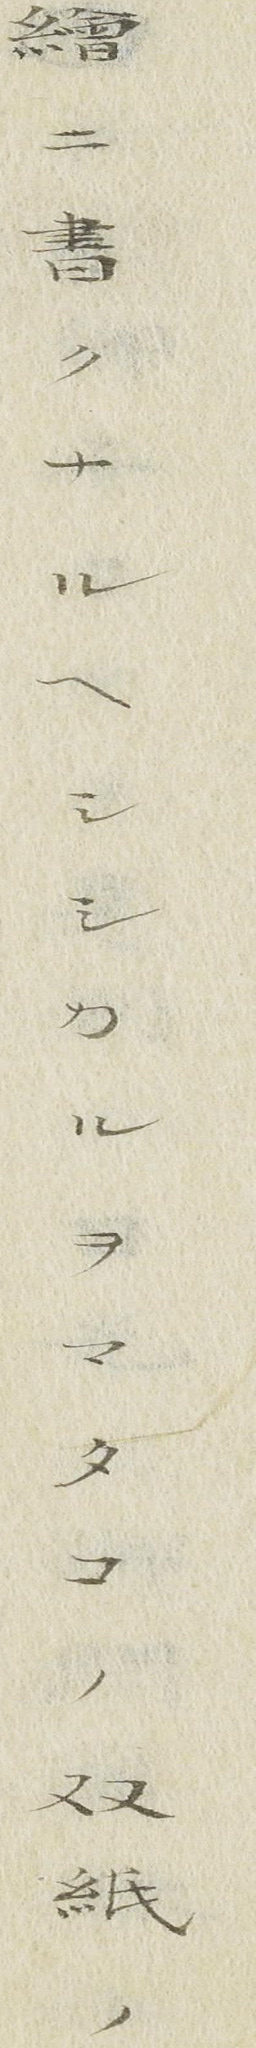絵ニ書クナルヘシシカルヲマタコノ双紙ノ
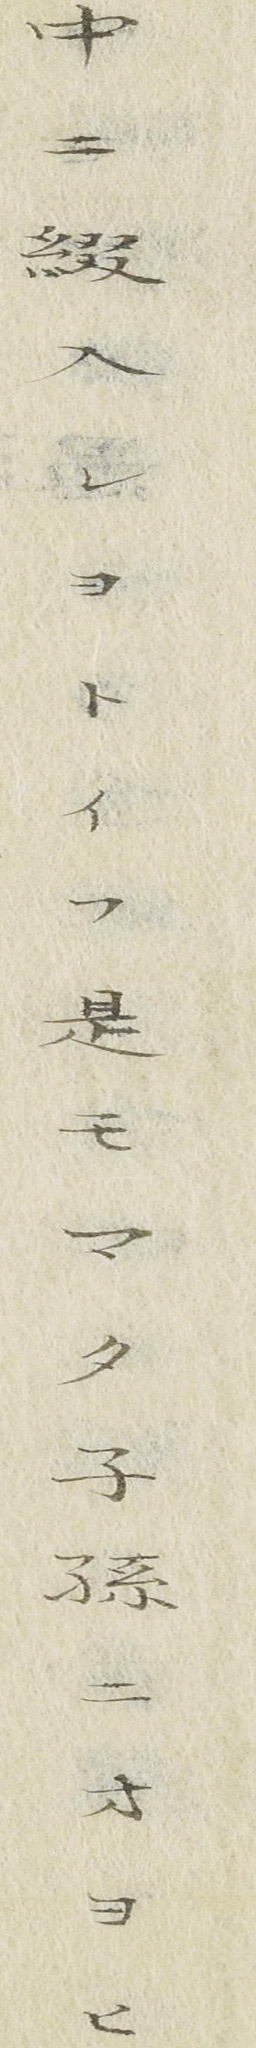中ニ綴入レヨトイフ是モマタ子孫ニオヨヒ
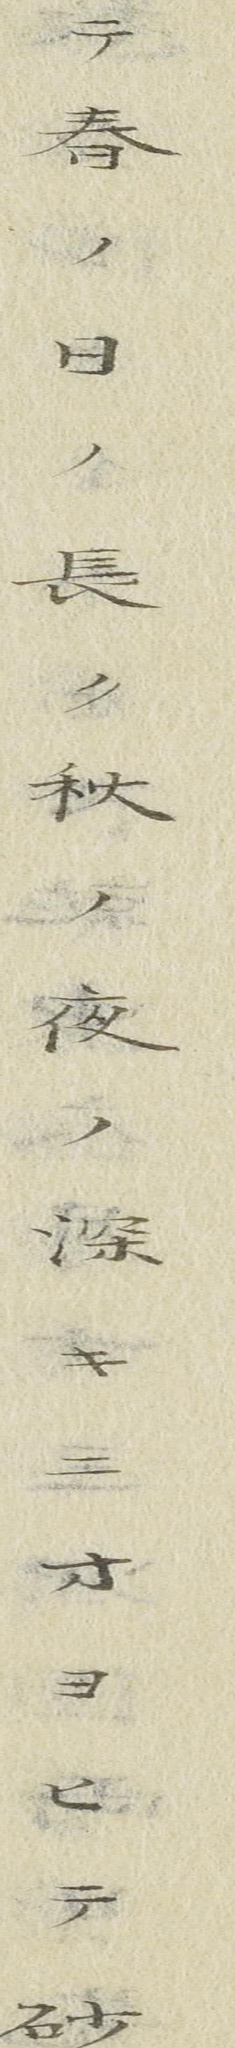テ春ノ日ノ長ク秋ノ夜ノ深キニオヨヒテ砂
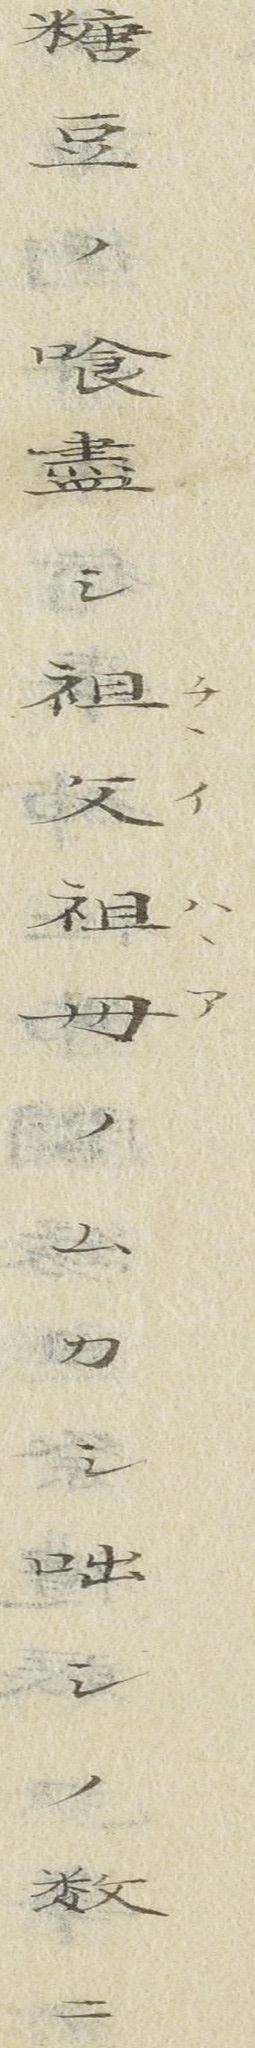糖豆ノ喰尽シ祖父祖母ノムカシ咄シノ数ニ
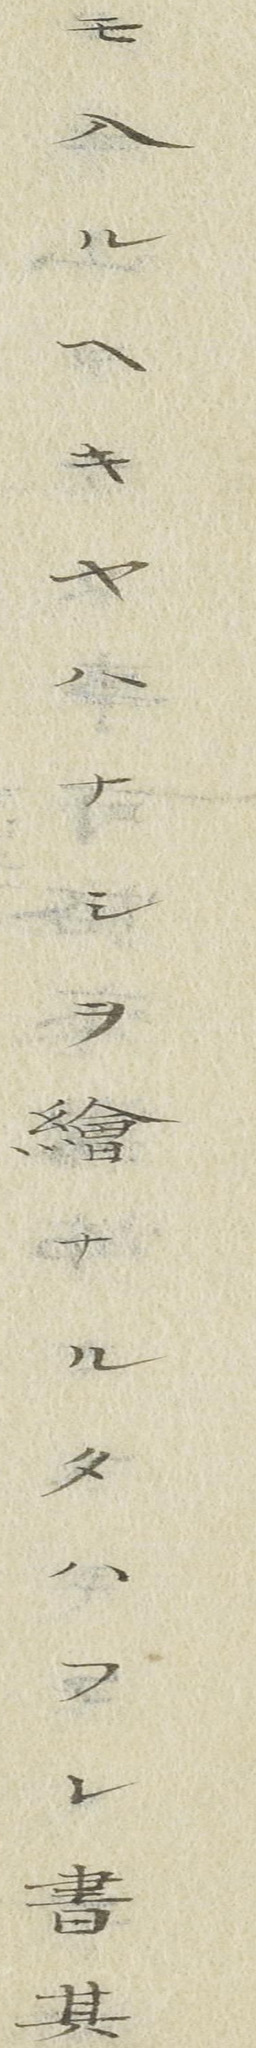モ入ルヘキヤハナシヲ絵ナルタハフレ書其
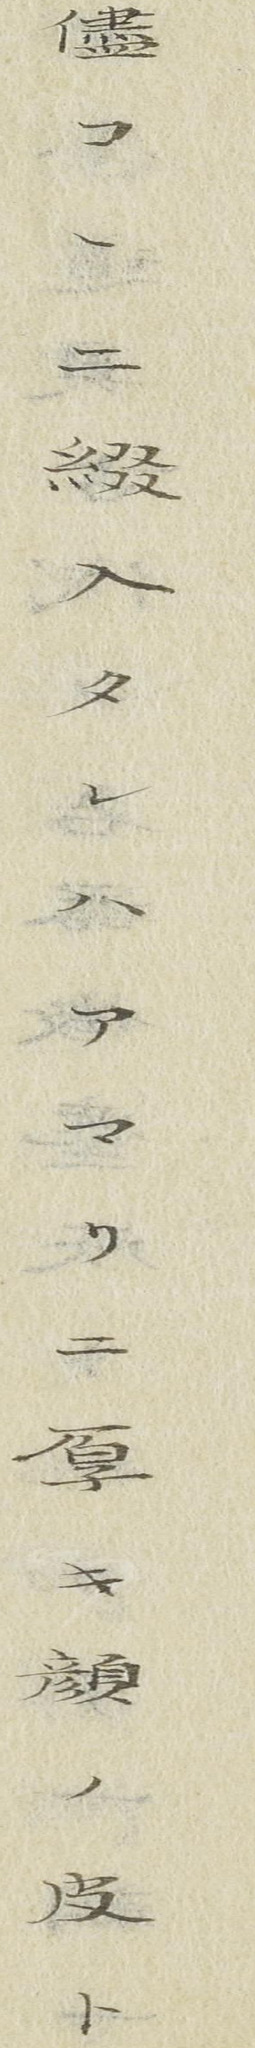侭コヽニ綴入タレハアマリニ厚キ顔ノ皮ト
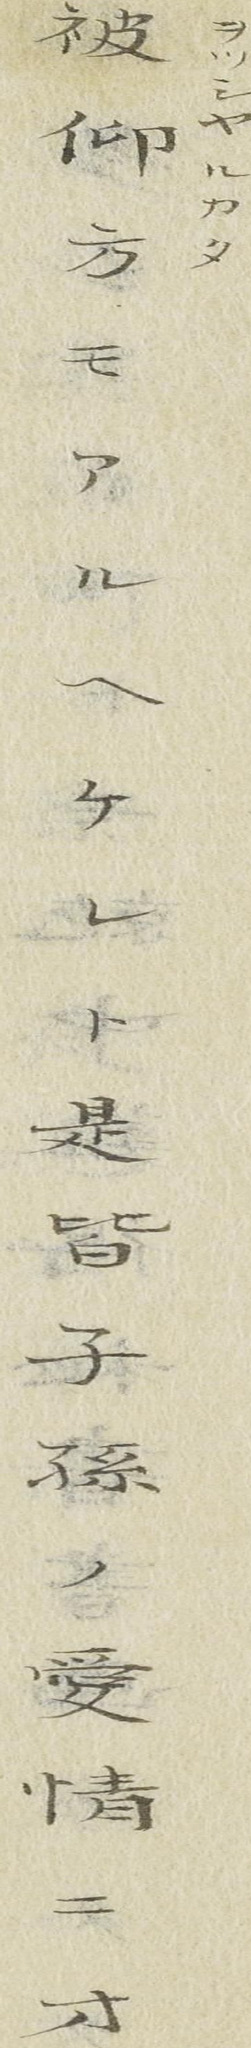被仰方モアルヘケレト是皆子孫ノ愛情ニオ
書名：地災撮要　地震之部　巻ノ二
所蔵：東京大学地震研究所図書室 Earthquake Research Institute Library, The University of Tokyo, JAPAN
